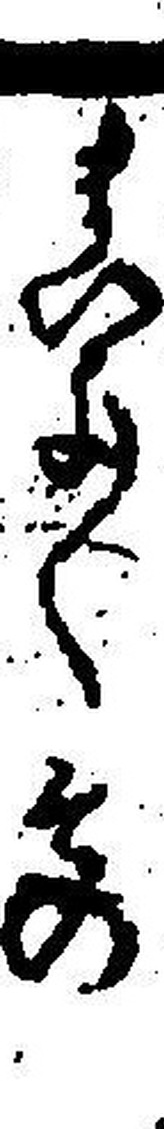まいよ〳〵その
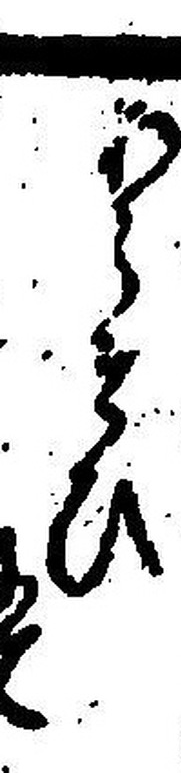あらそひ
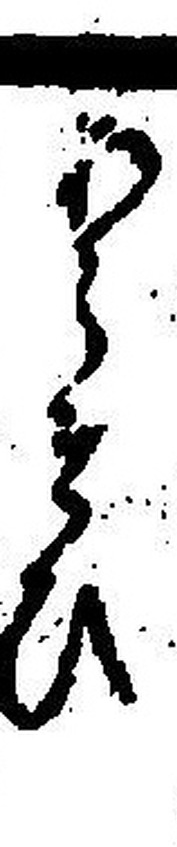あらそひ
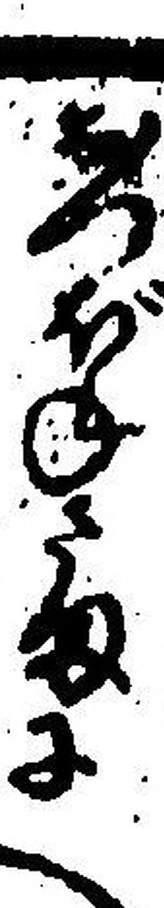おつぼねさまに
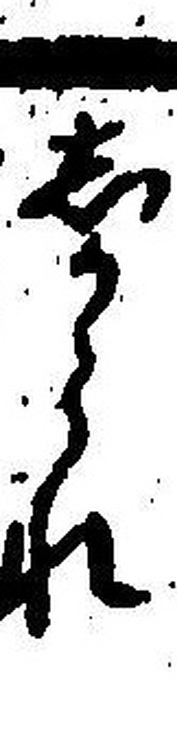しかられ
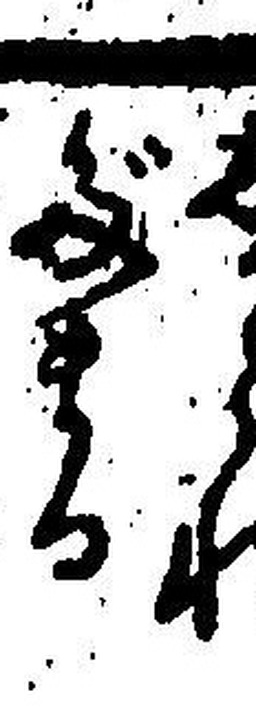だまる
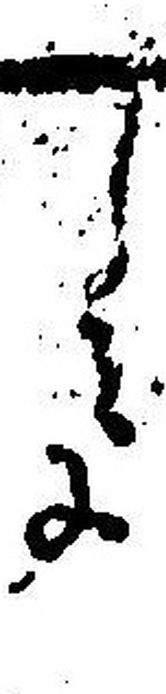しみに
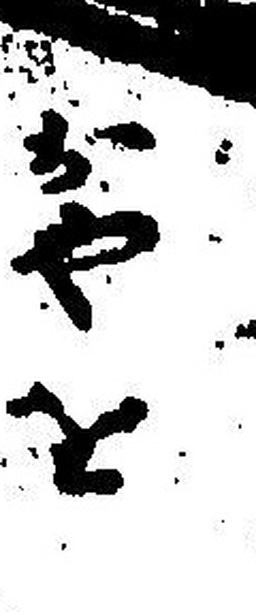おやを
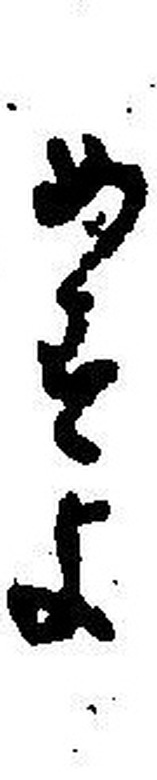めすよ
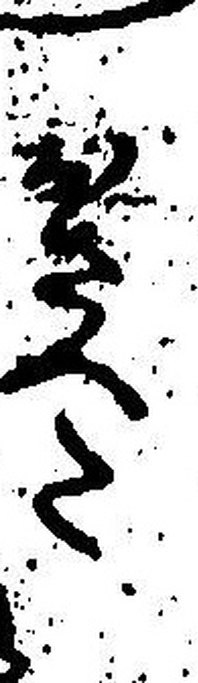おさへた
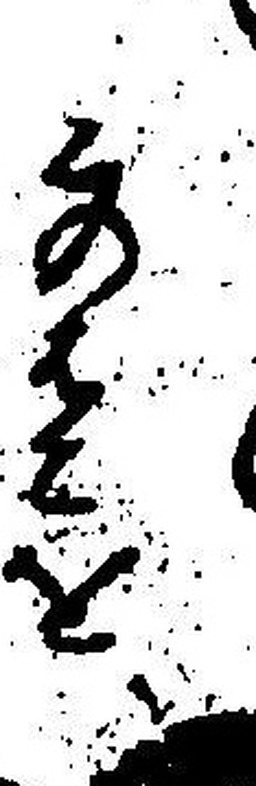このはこを

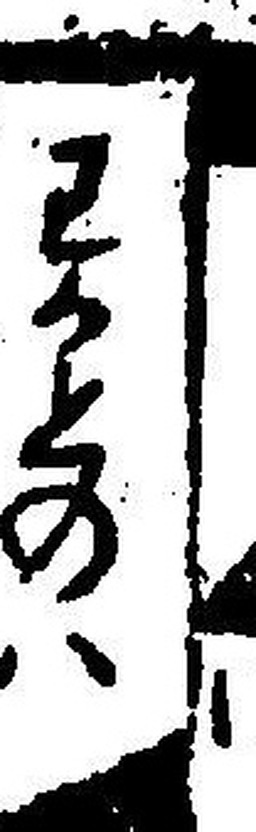わかとのは
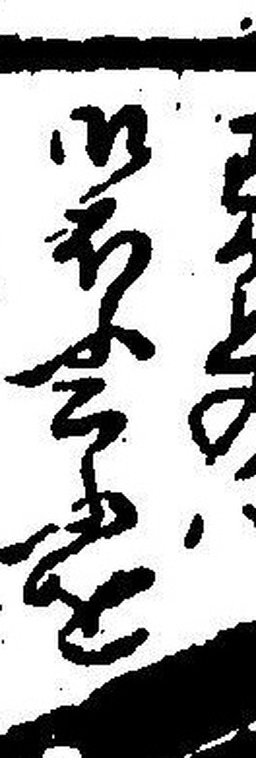御ほふこふを
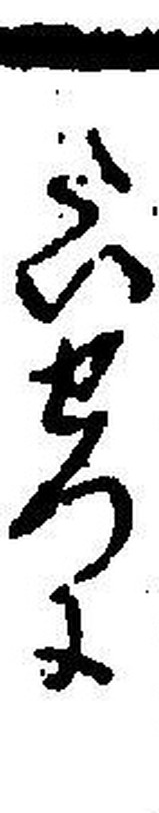たいせつに
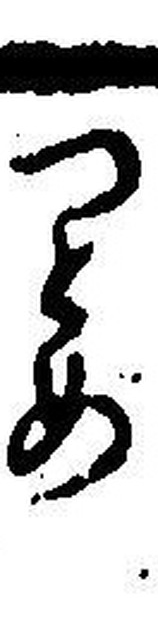つとめ
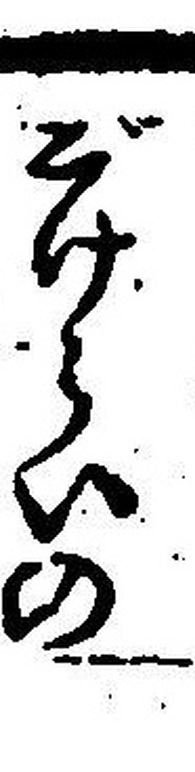ごけらいの
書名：御代参牛時詣 / 市場通笑作
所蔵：東京大学総合図書館 General Library in the University of Tokyo, JAPAN
